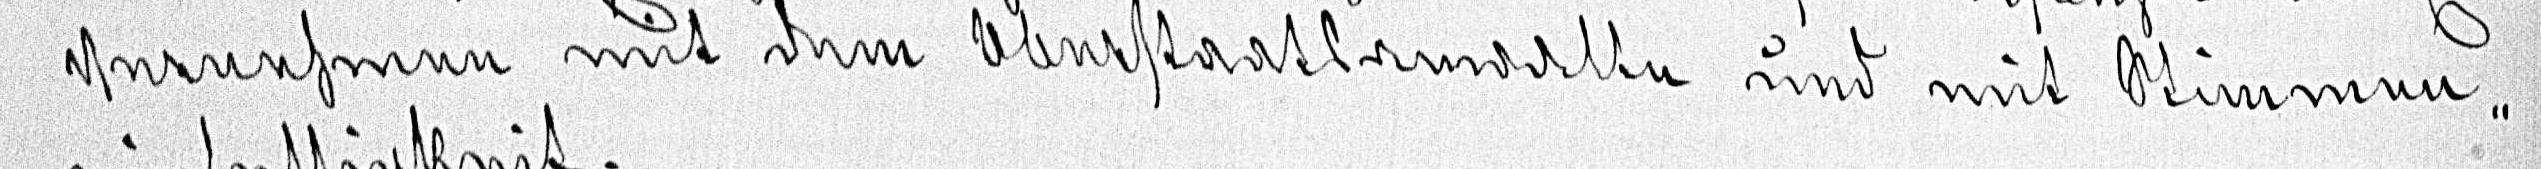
vernehmen mit dem Oberstaatsanwalte und mit Stimmen¬
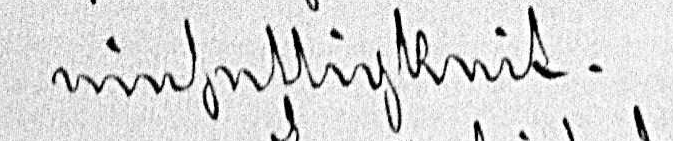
einhelligkeit.
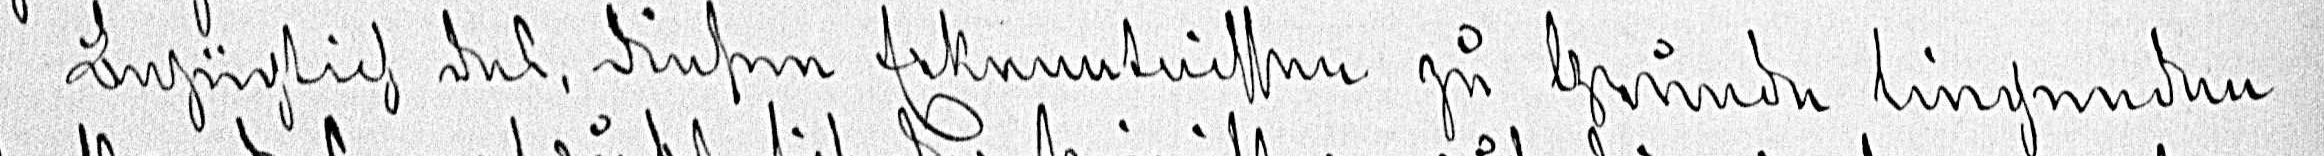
Bezüglich des, diesen Erkenntnissen zu Grunde liegenden
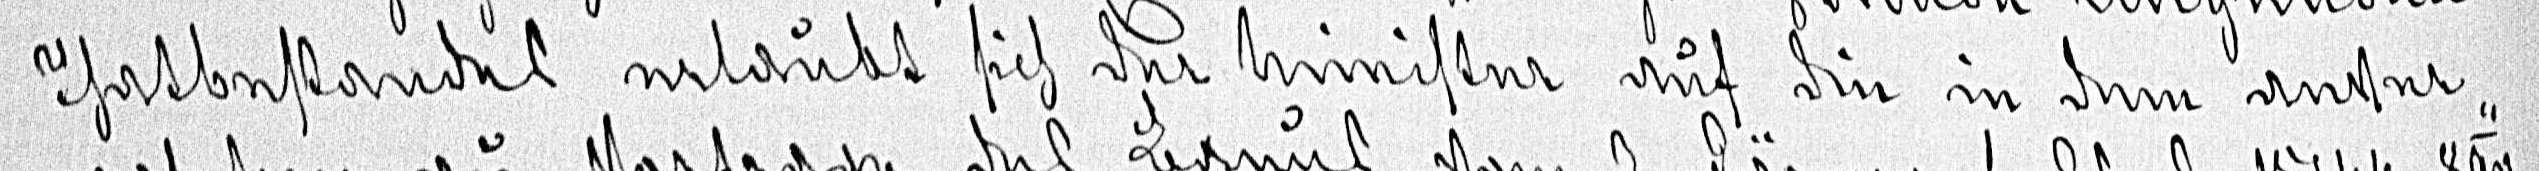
Thatbestandes erlaubt sich der Minister auf die in dem anver¬
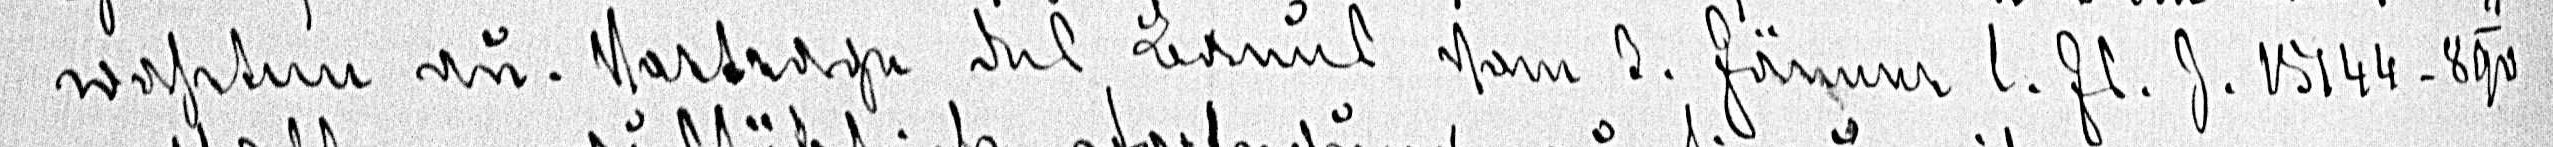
wahrten au. Vortrage des Banus vom 3. Jänner l. Js. Z. 15144-1890
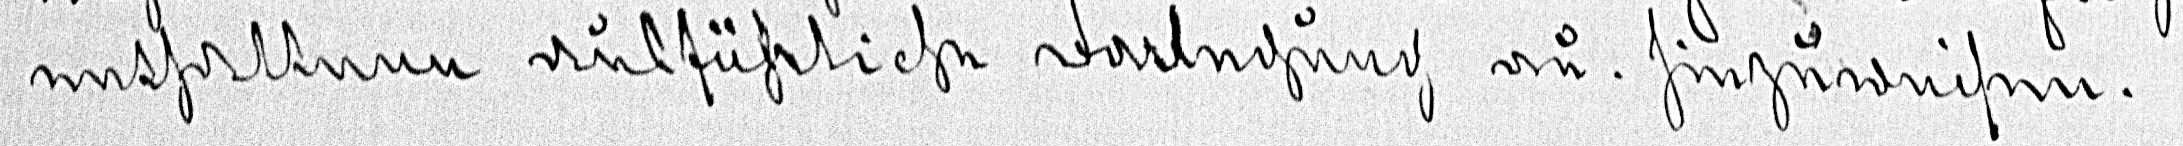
enthaltene ausführliche Darlegung au hinzuweisen.
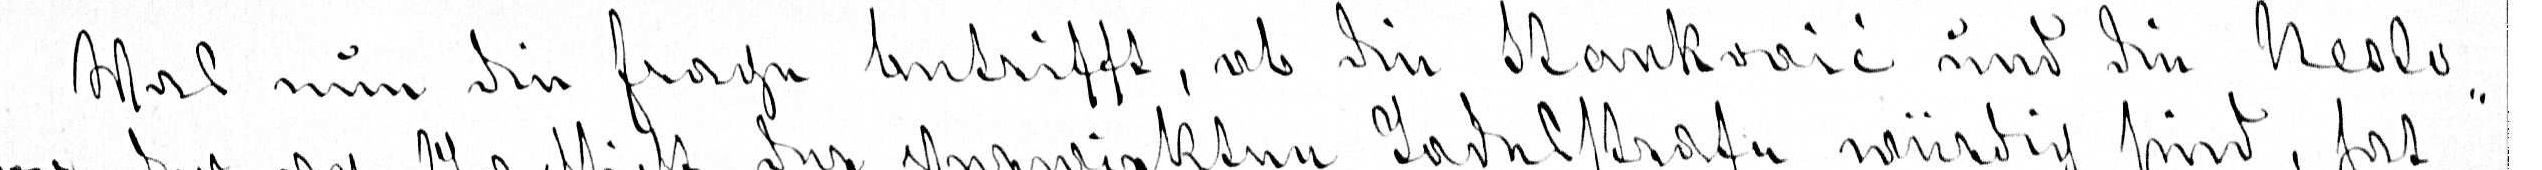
Was nun die Frage betrifft, ob die Skanković und die Nesto¬
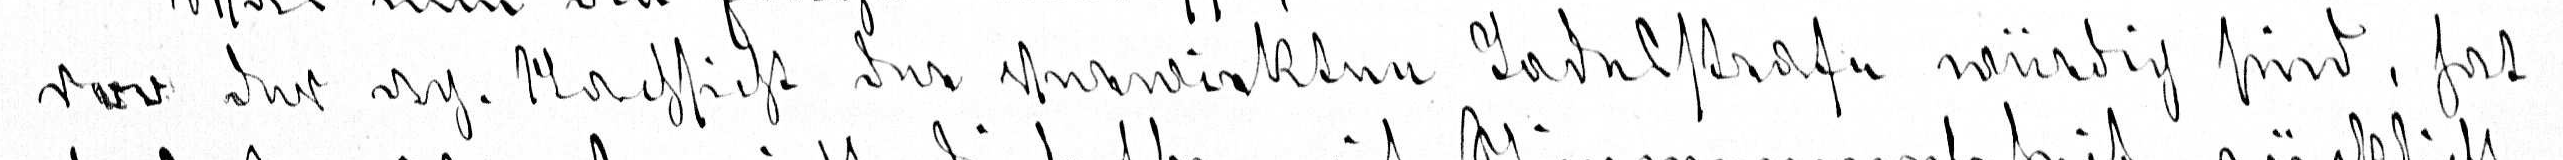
rov der ag. Nachsicht der verwirkten Todesstrafe würdig sind, hat
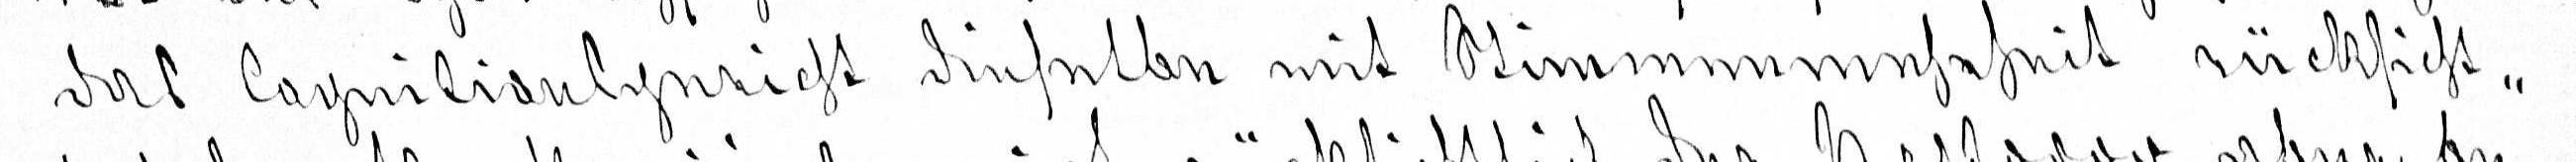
das Cognitionsgericht dieselbe mit Stimmenmehrheit rücksicht¬
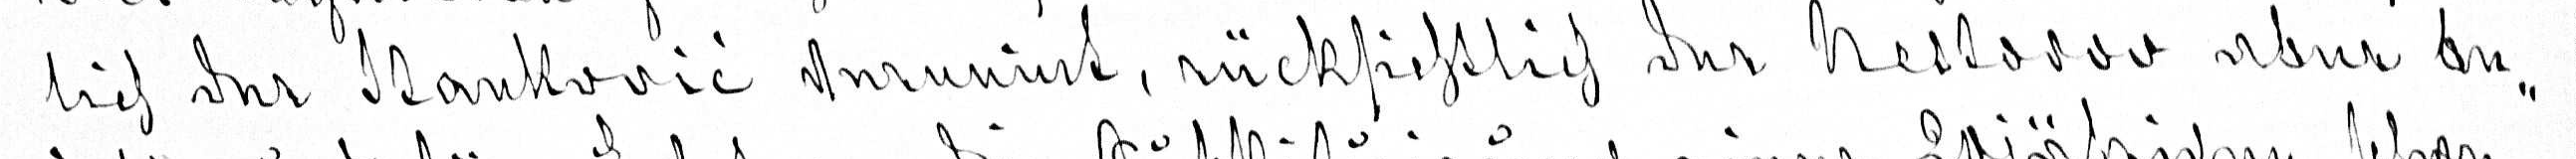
lich der Skanković verneint, rücksichtlich der Nestorov aber be¬
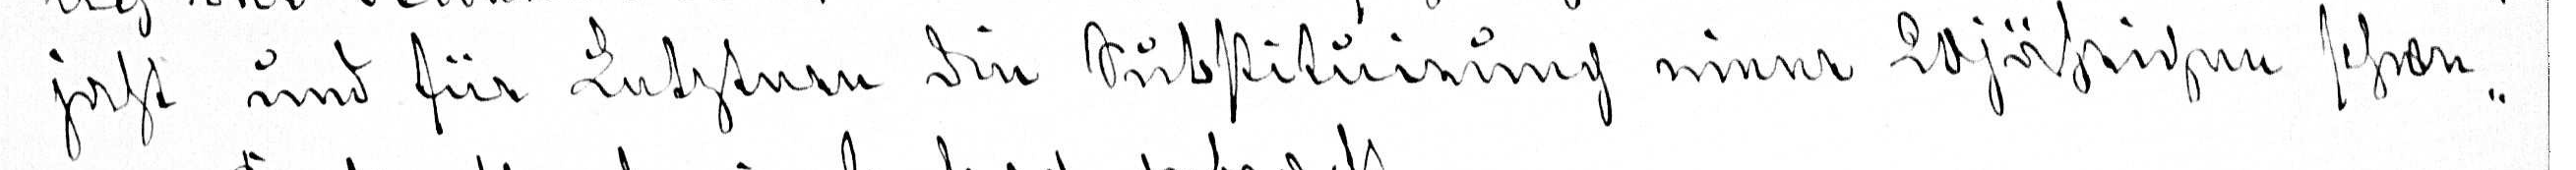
jaht und für Letztere die Substituierung einer 20jährigen schwe¬
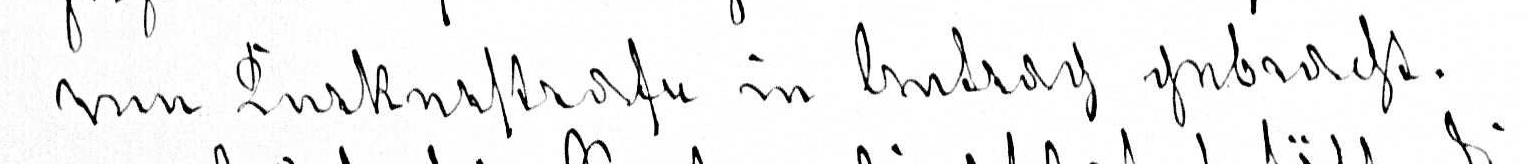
ren Kerkerstrafe in Antrag gebracht.
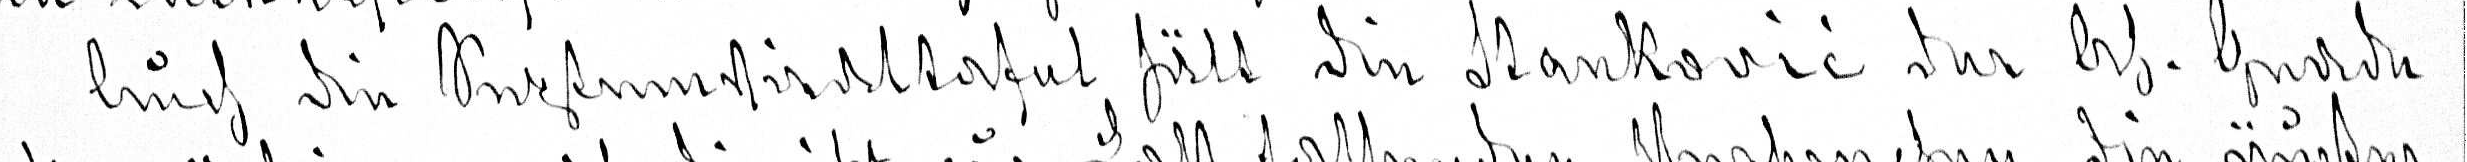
Auch die Septemviraltafel hält die Skanković der Ah. Gnade
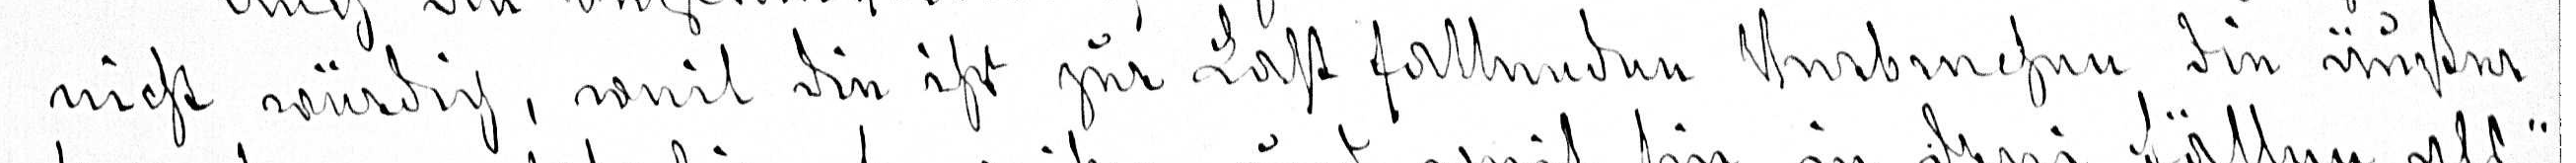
nicht würdig, weil die ihr zur Last fallenden Verbrechen die äußers¬
